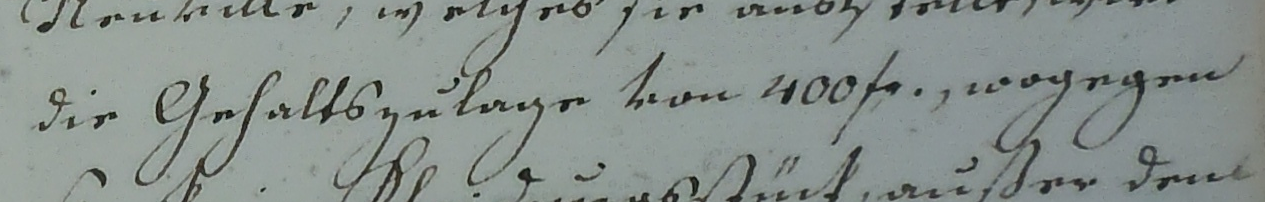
die Gehaltszulage von 400 fr., wogegen
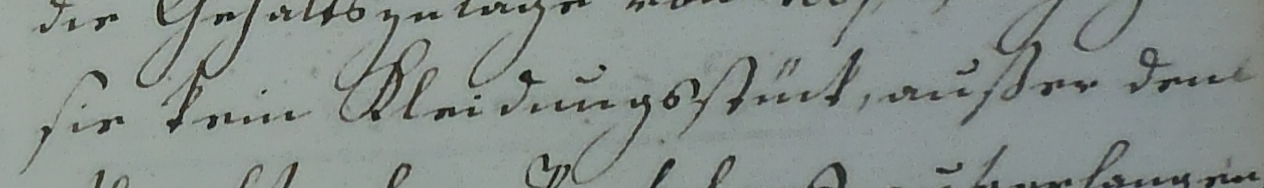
sie kein Kleidungsstück, außer den
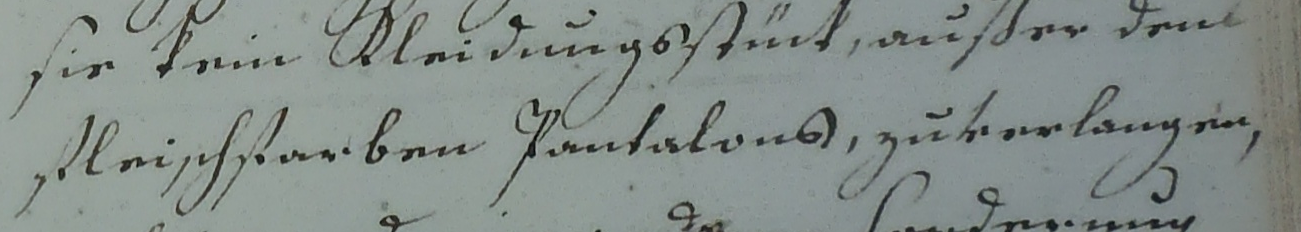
fleischfarben Pantalons, zuverlangen,
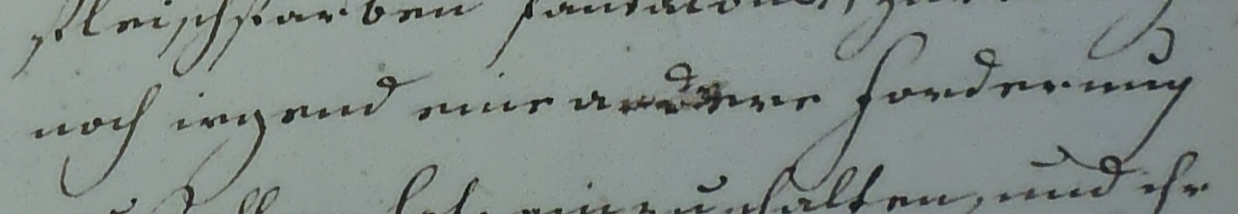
noch irgend eine andere Forderung
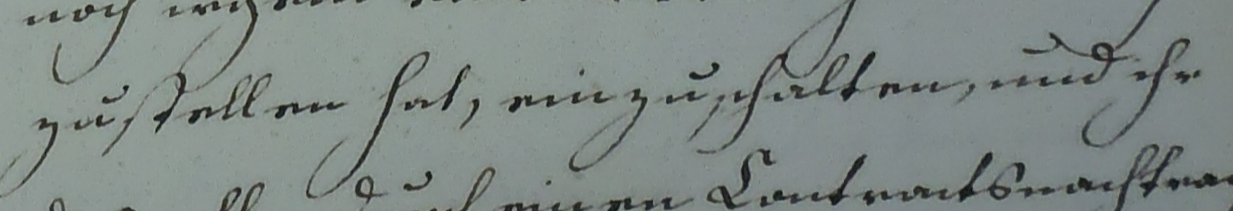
zustellen hat, einzuschalten, und ihr
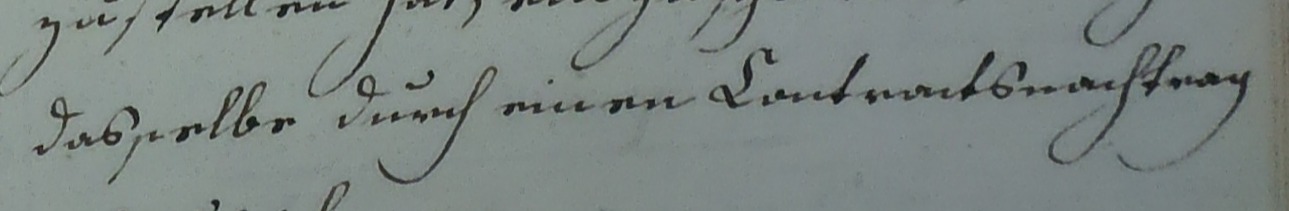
dasselbe durch einen Contractsnachtrag,
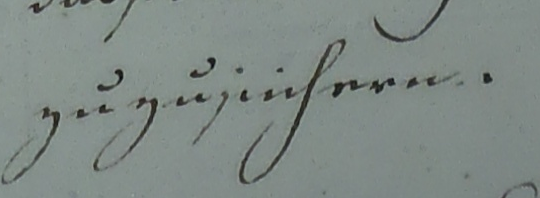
zuzusichern.
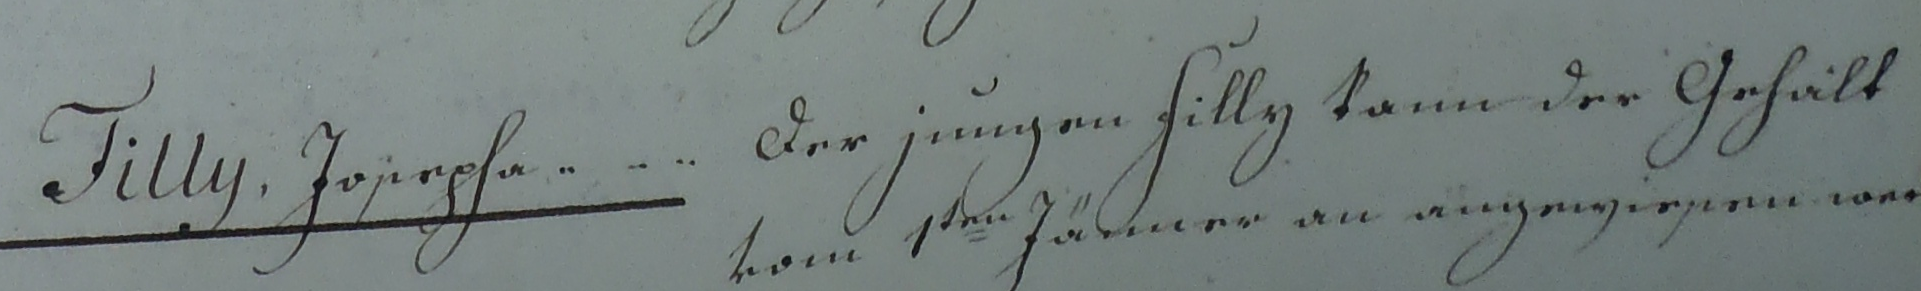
Filly, Josepha .. .. .. Der jungen Filly kann der Gehalt
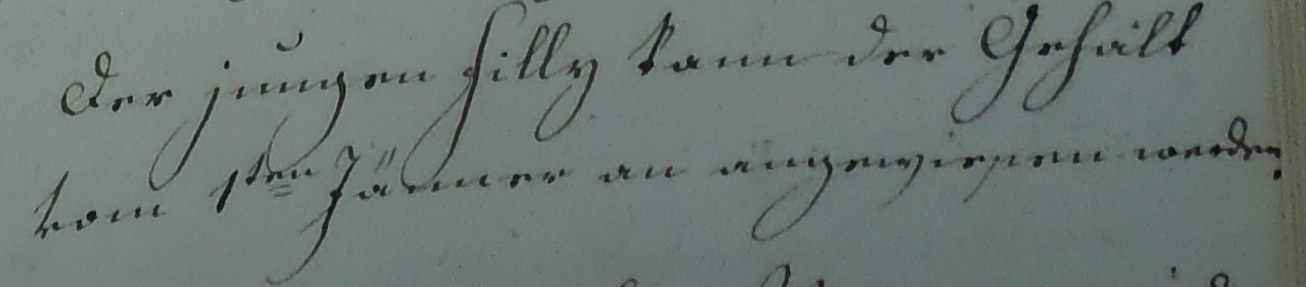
vom 1te͇n Jänner an angewiesen werden.
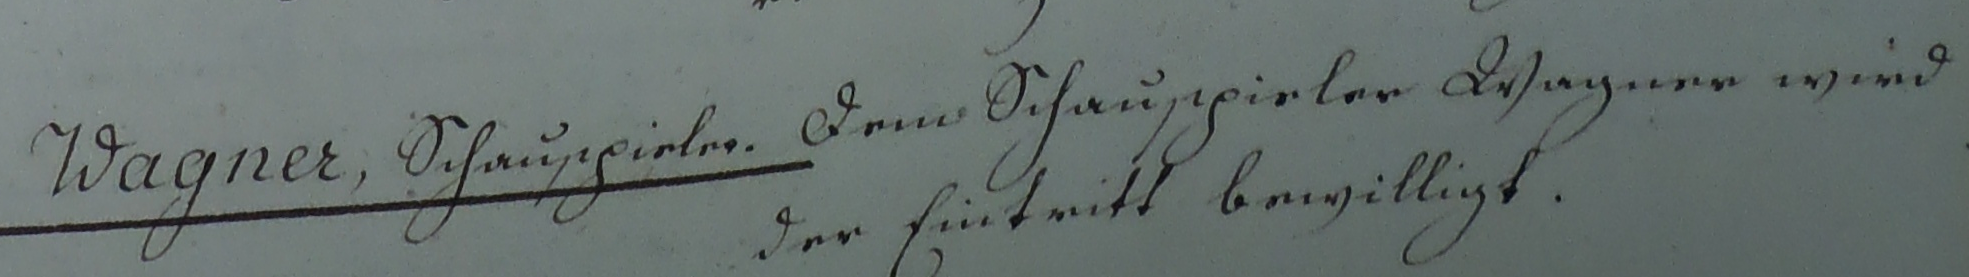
Wagner, Schauspieler. Dem Schauspieler Wagner wird
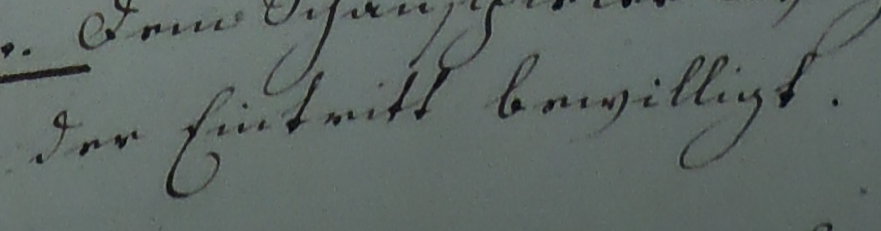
der Eintritt bewilligt.
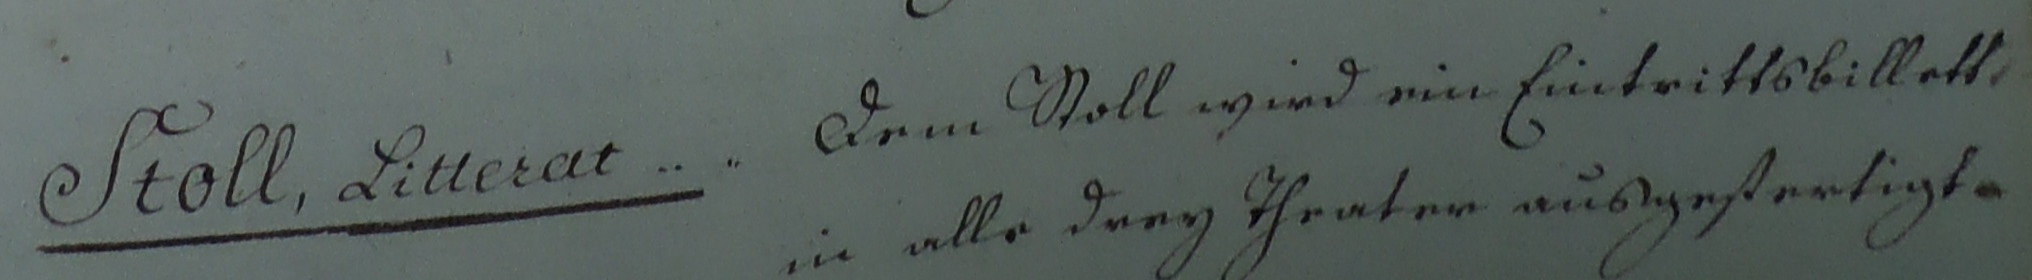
Stoll, Litterat .. .. Dem Stoll wird ein Entrittsbillett,
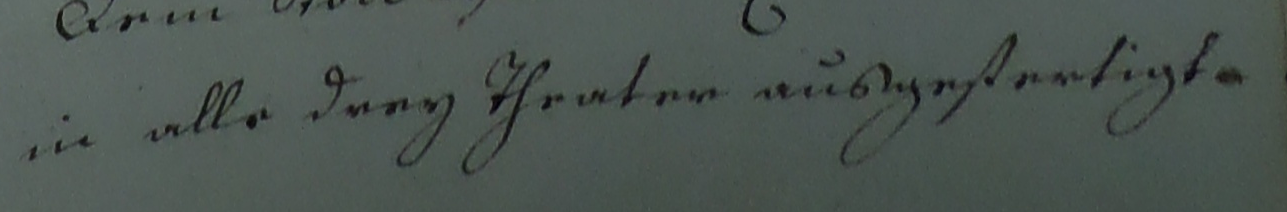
in alle drey Theater ausgefertigt.
